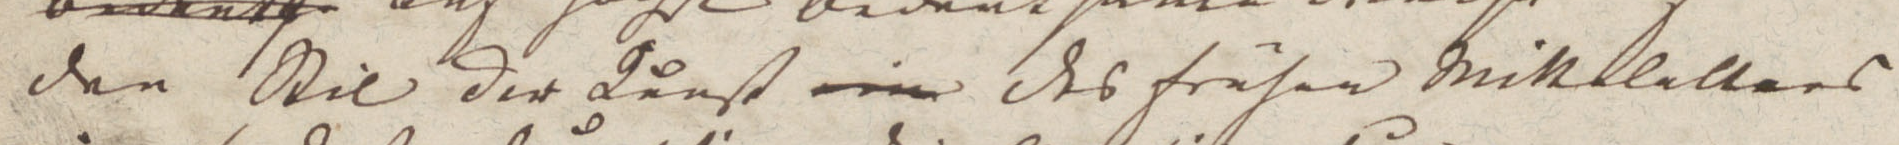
den Stil der Kunst wie des frühen Mittelalters
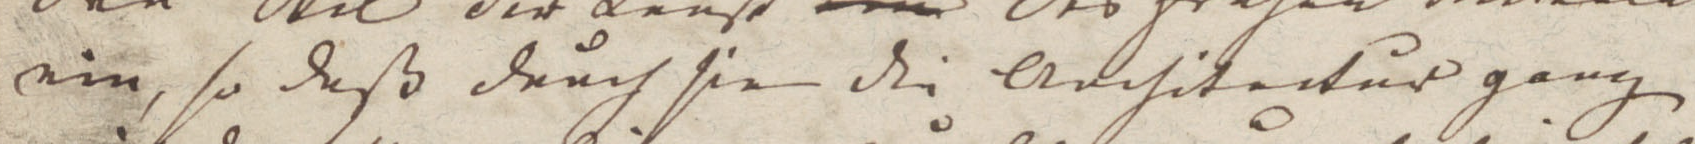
ein, so dass durch sie die Architectur ganz
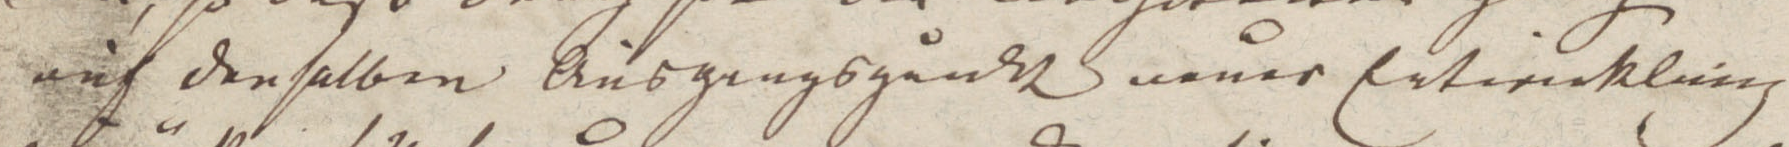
auf denselben Ausgangspunkt neuer Entwicklung
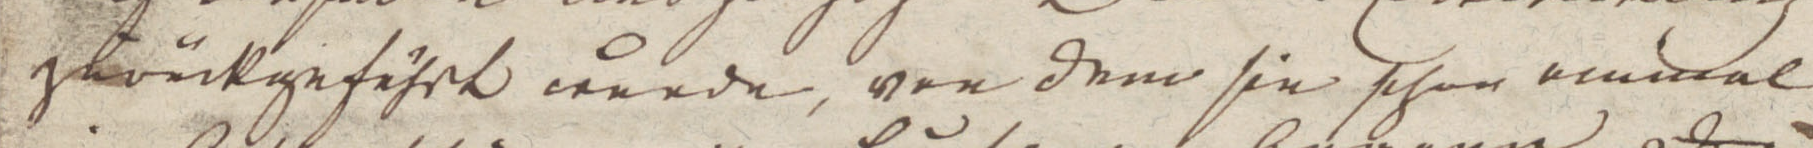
zurückgeführt wurde, von dem sie schon einmal
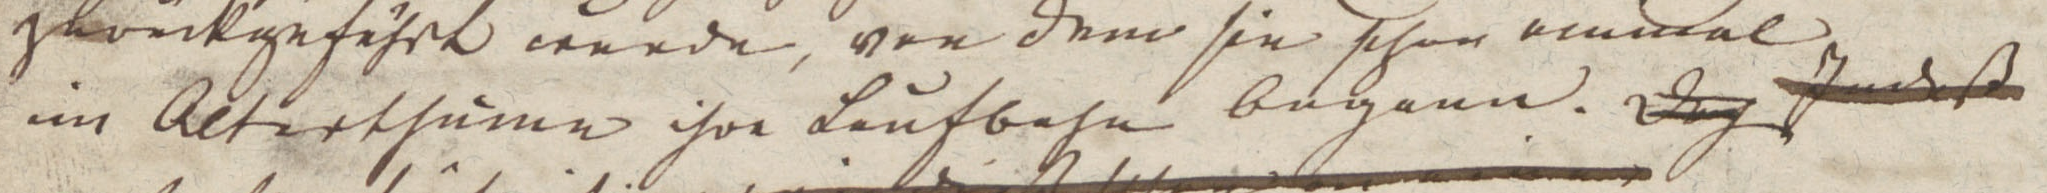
im Alterthume ihre Laufgahn begann. Doch Indess
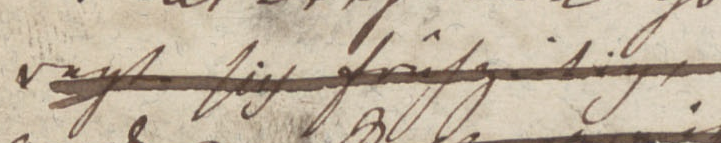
wie diess schon an einer
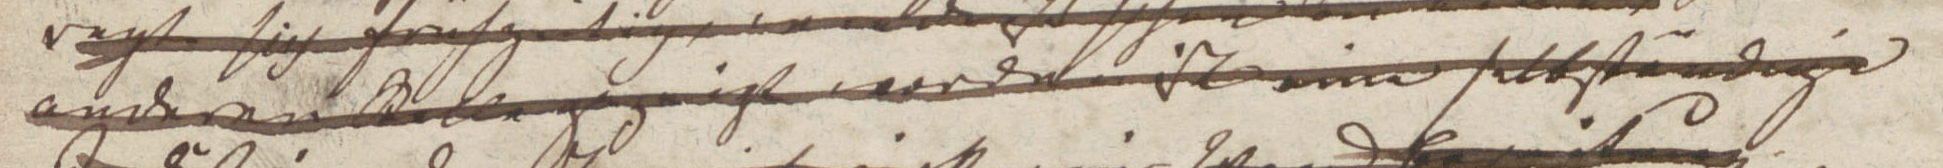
anderen Stelle gezeigt worden ist eine selbständige
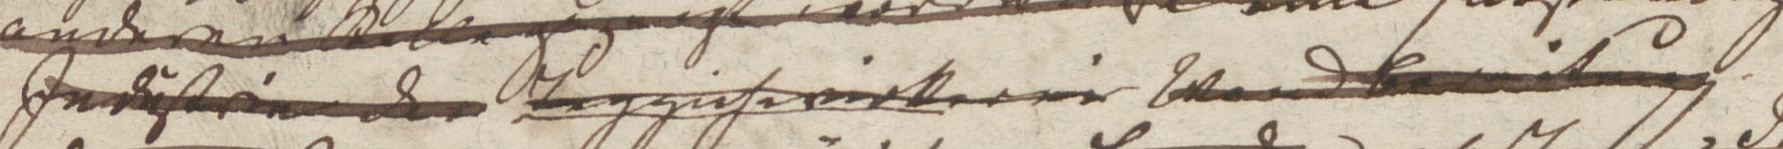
Industrie der Teppichewirkerei Wandbereitung
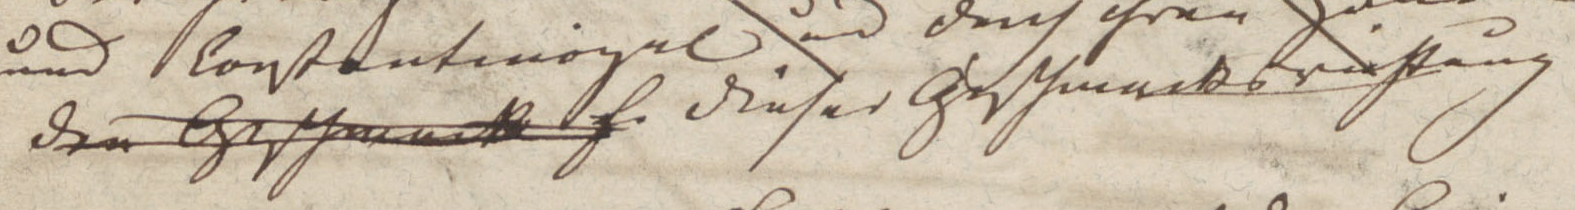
den Geschmack f dieser Geschmacksrichtung
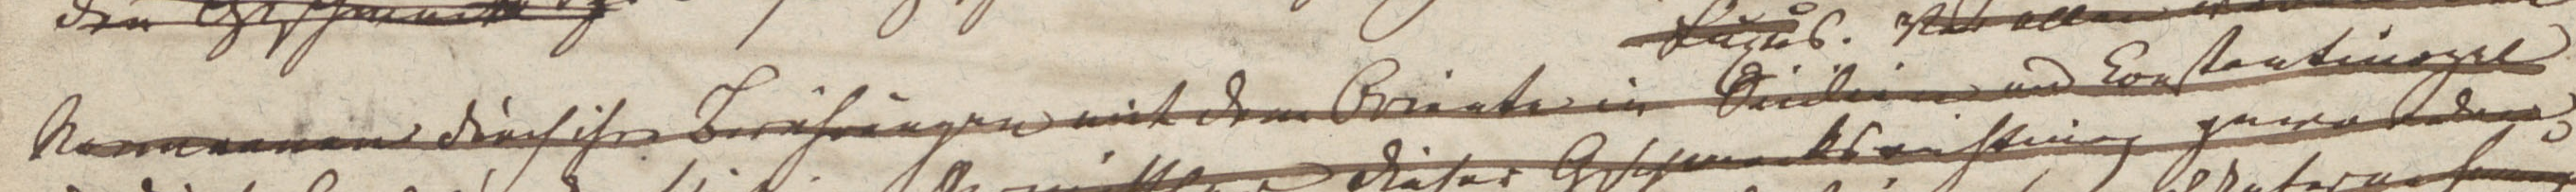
Normannen durch ihre Berührungen mit dem Oriente in Sicilien und Constantinopel
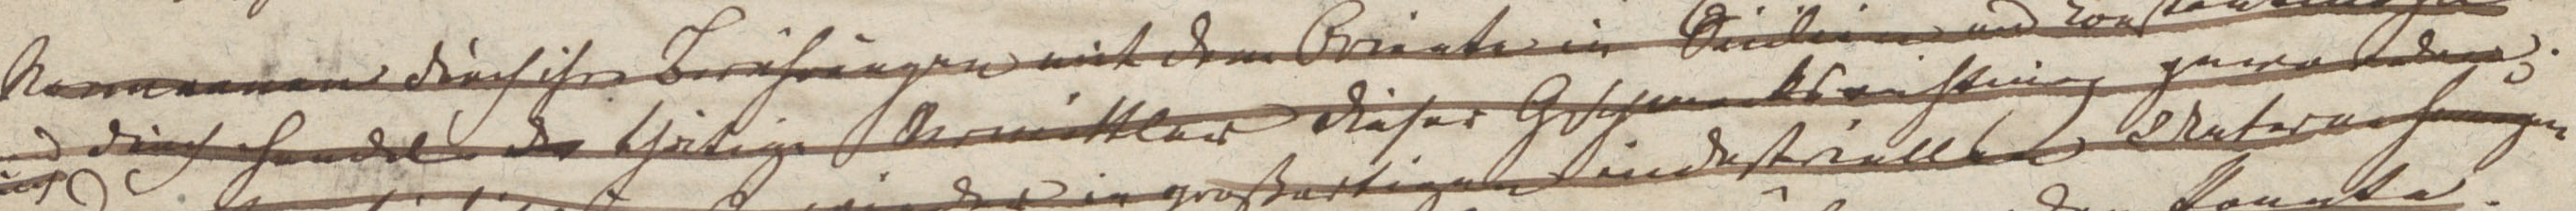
und durch Handel der thätige Vermittler dieser Geschmacksrichtung geworden.
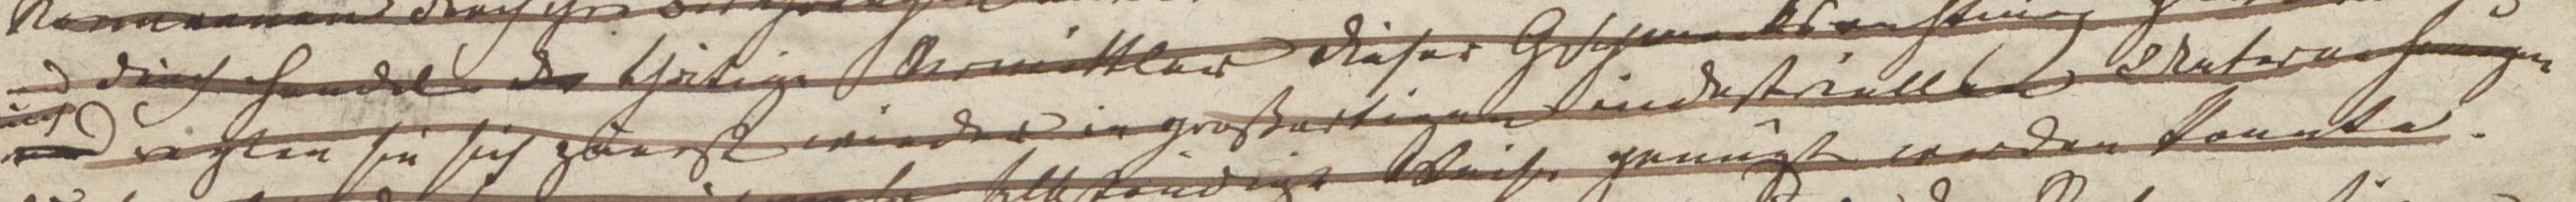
und auch sie sich zuerst wieder in grossartigen industriellen Unternehmungen
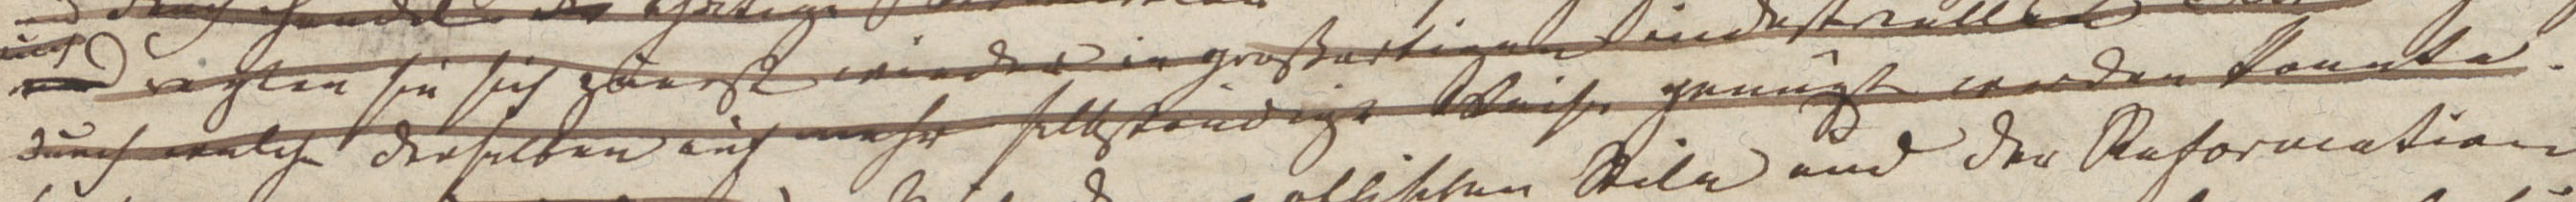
durch welche derselben auf mehr selbständige Weise genügt werden konnte.
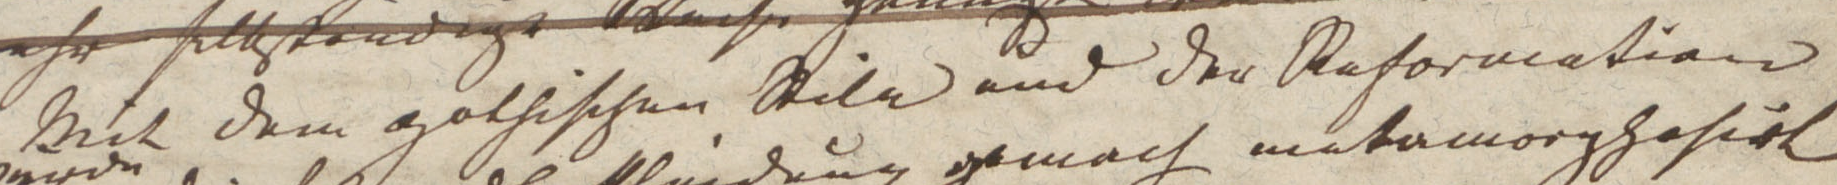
Mit dem gothischen Stile und der Reformation
